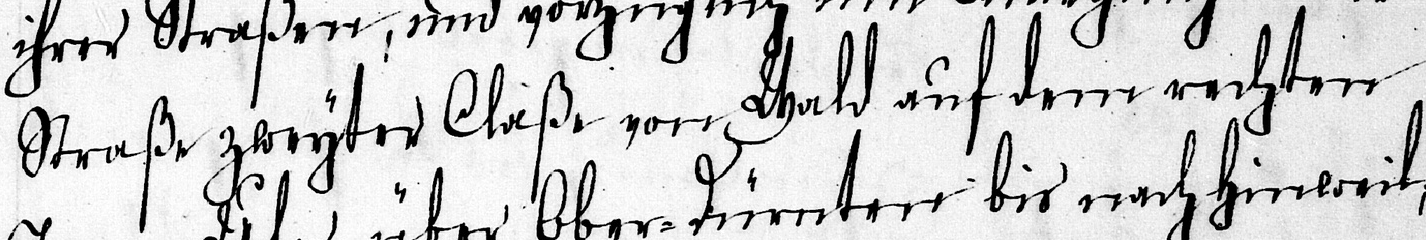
Straße zweyter Claße von Wald auf dem rechten
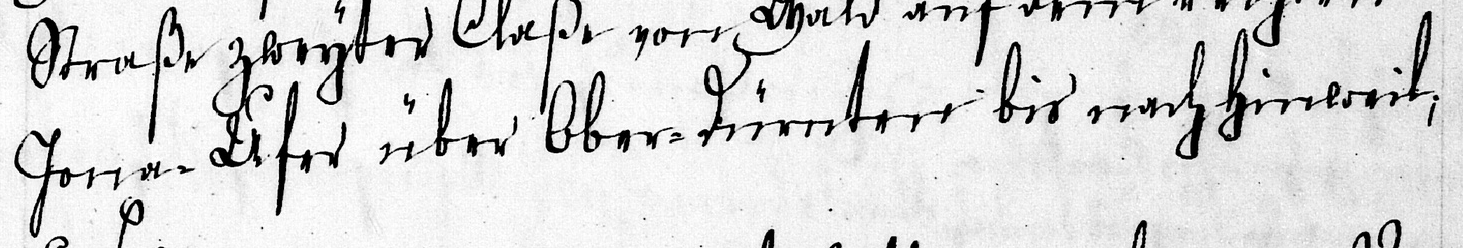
Jona-Ufer über Ober-Dürnten bis nach Hinweil,
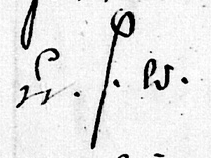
u. s. w.
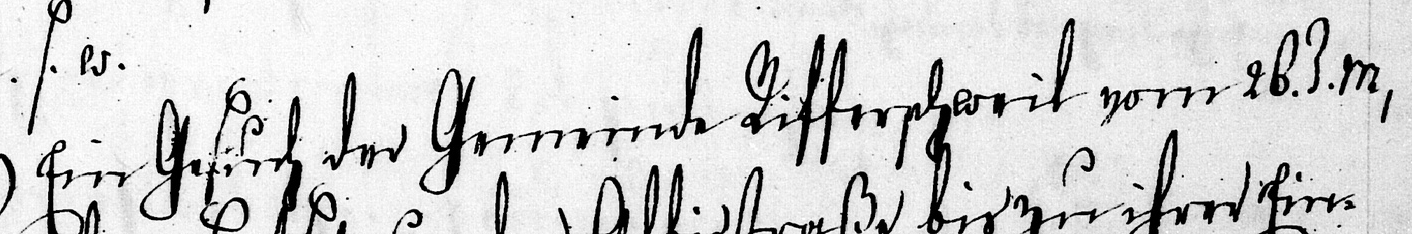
Ein Gesuch der Gemeinde Rifferschweil vom 26. d.
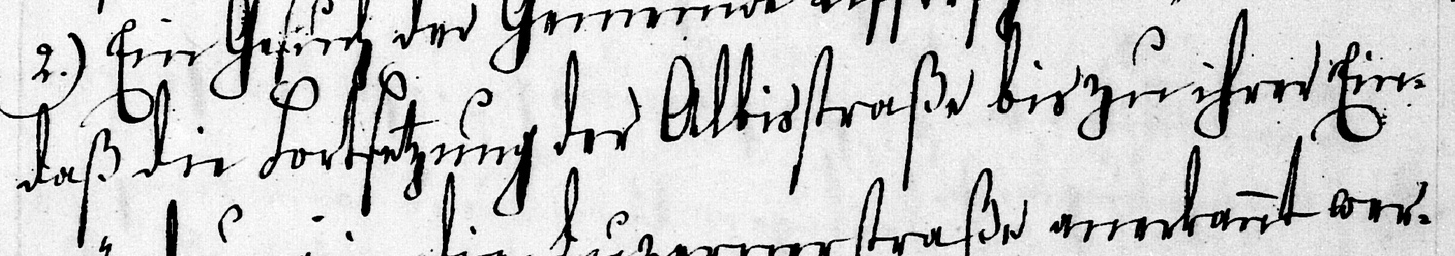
daß die Fortsetzung der Albisstraße bis zu ihrer Ein¬
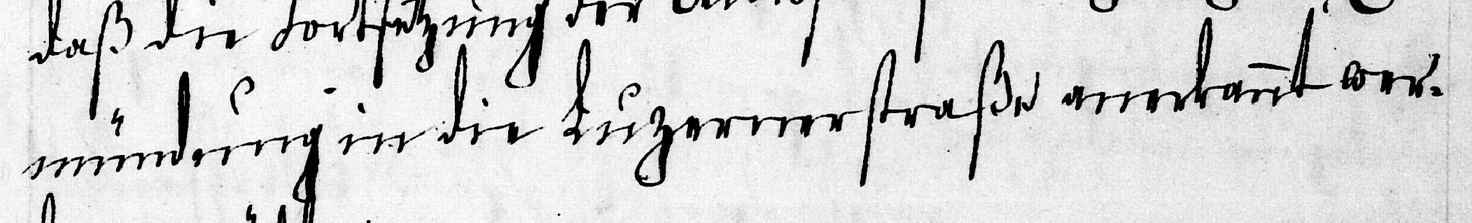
mündung in die Luzernerstraße anerkannt wer¬
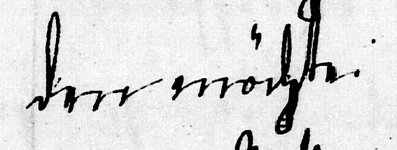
den möchte.
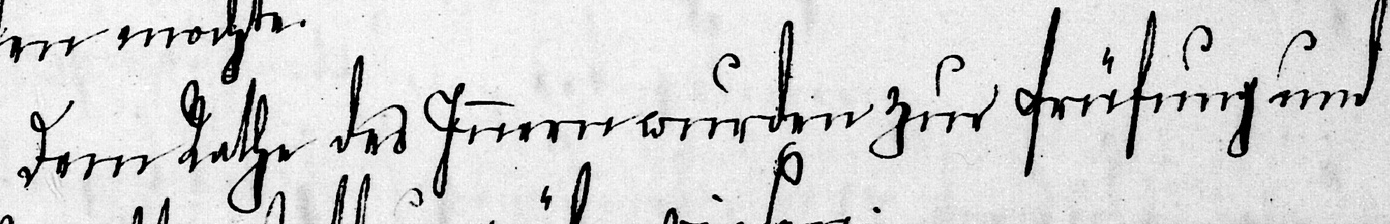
Dem Rathe des Innern wurden zur Prüfung und
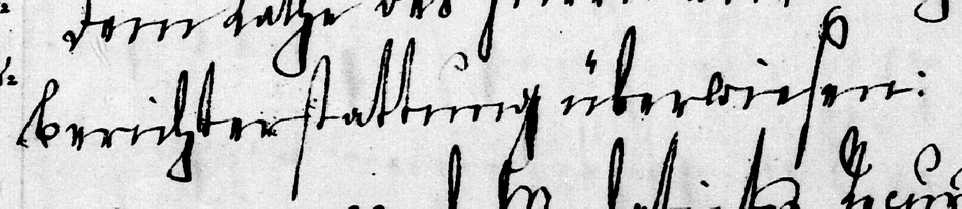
Berichterstattung überwiesen:
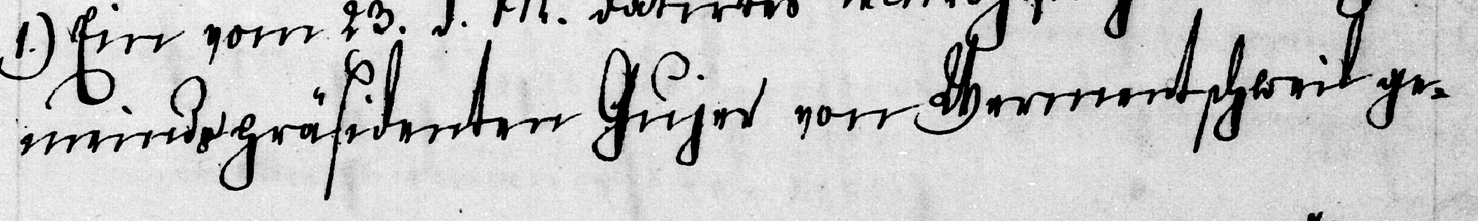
meindspräsidenten Gujer von Wermentschweil ge-
